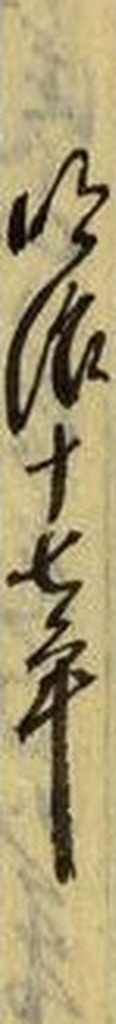明治十七年
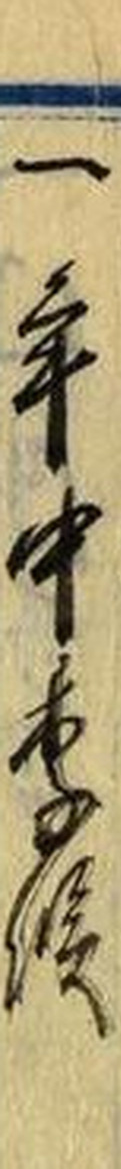一年中季候
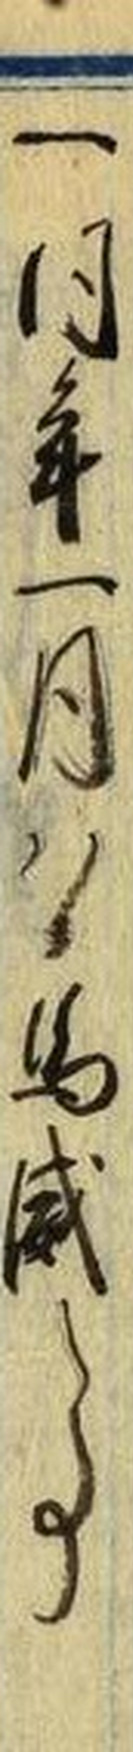一同年一月八日馬威之事
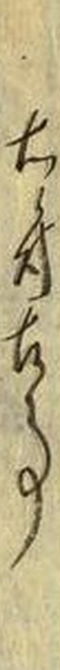右に付古事
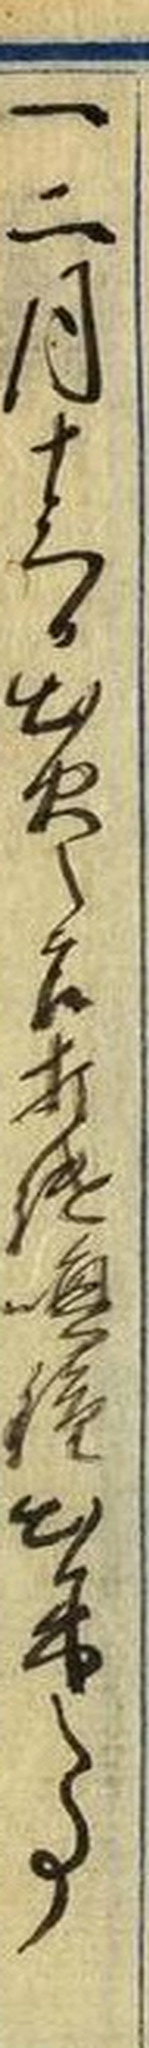一二月十三日出火之節打継喚鐘出来之事
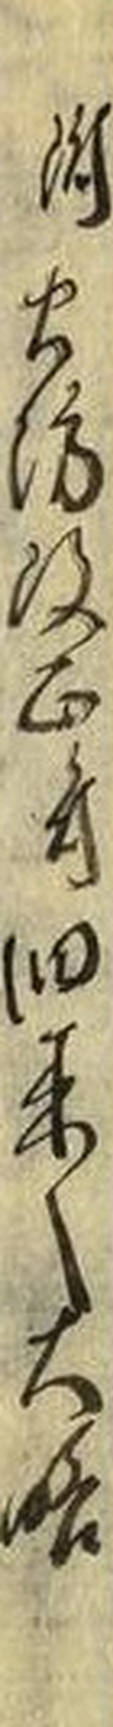附火防改正に付旧来之大略
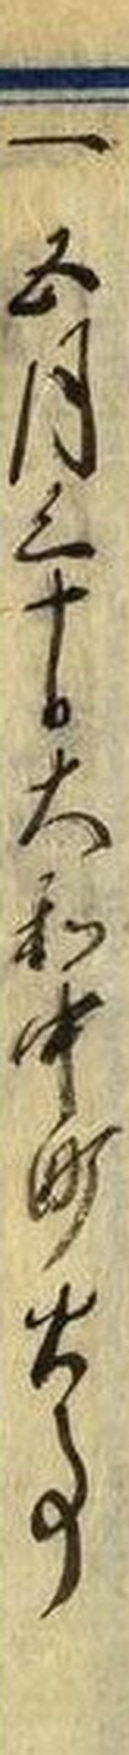一五月三十日大和中町火事
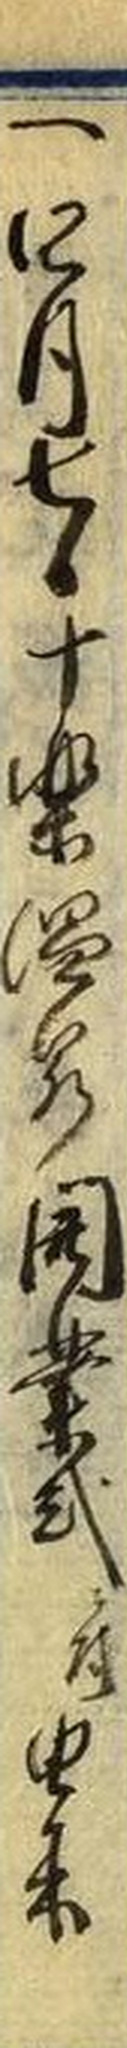一四月七日十楽温泉開業式に付由来
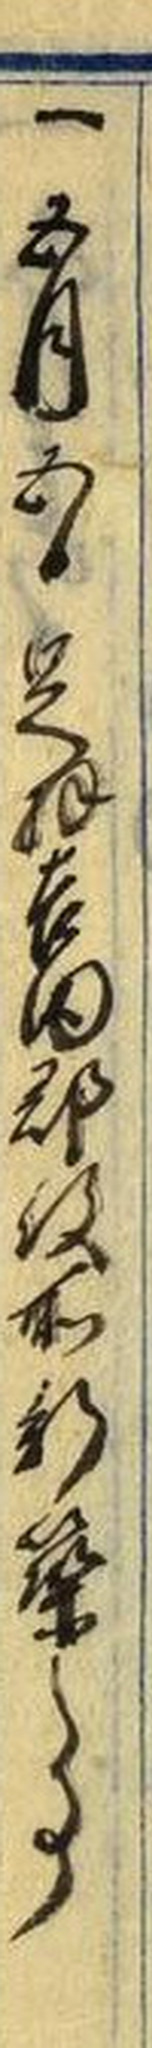一五月五日足羽吉田郡役所新築之事

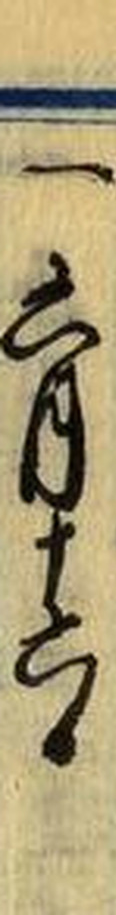一六月十六日
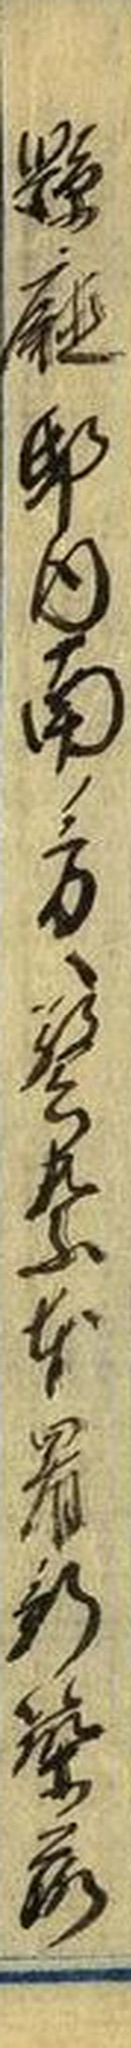県庁邸内南の方へ警察本署新築落
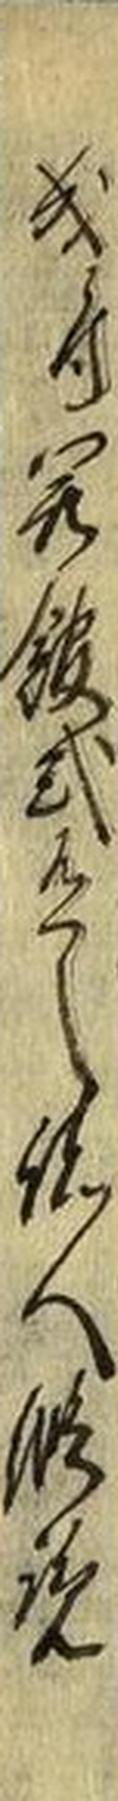成に付開館式有之諸人縦覧
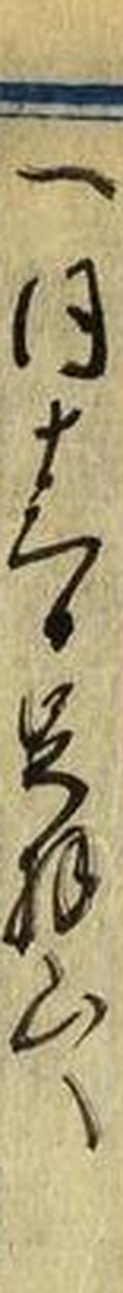一同十三日足羽山へ
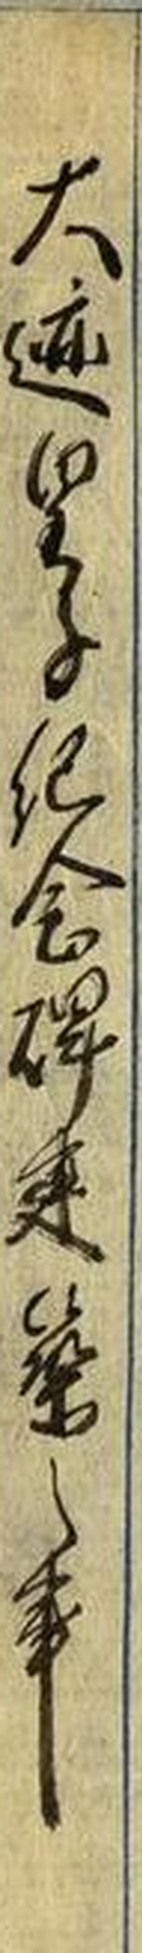大迹皇子記念碑建築之事
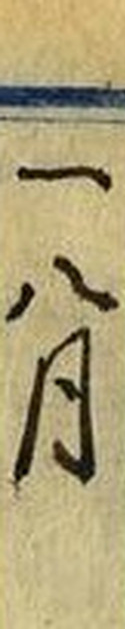一八月
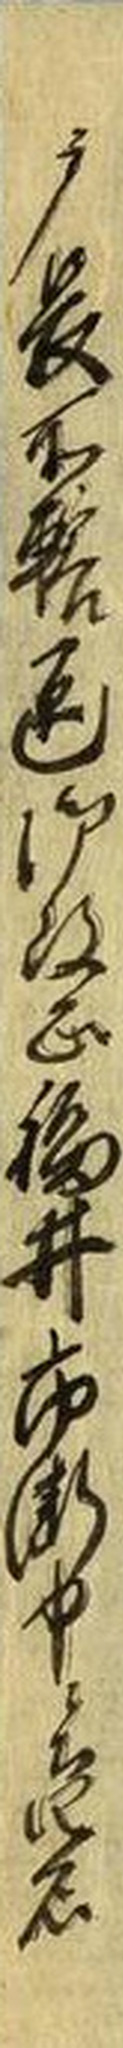戸長所轄区御改正福井市街中に而四名
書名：温古集 五巻
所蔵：福井県文書館 Fukui Prefectural Archives
